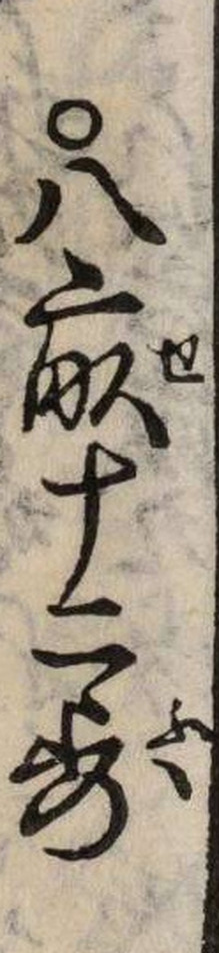⚪︎八畝十二歩
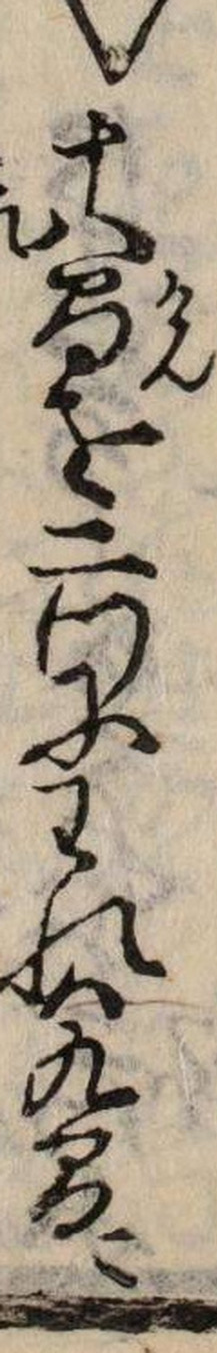十八間を二つにわれは九間に
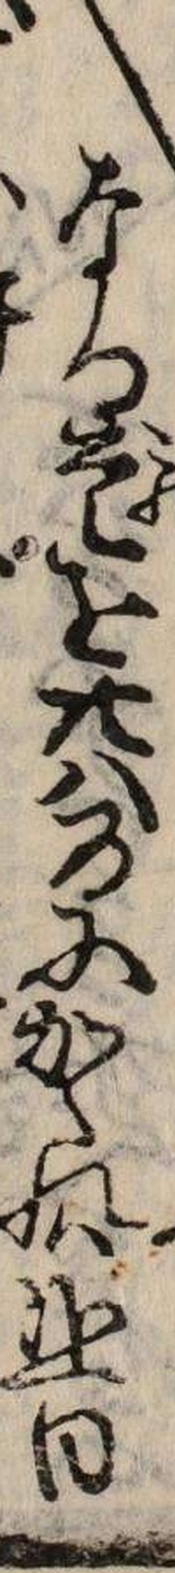なる是を廿八間にかくれは弍百
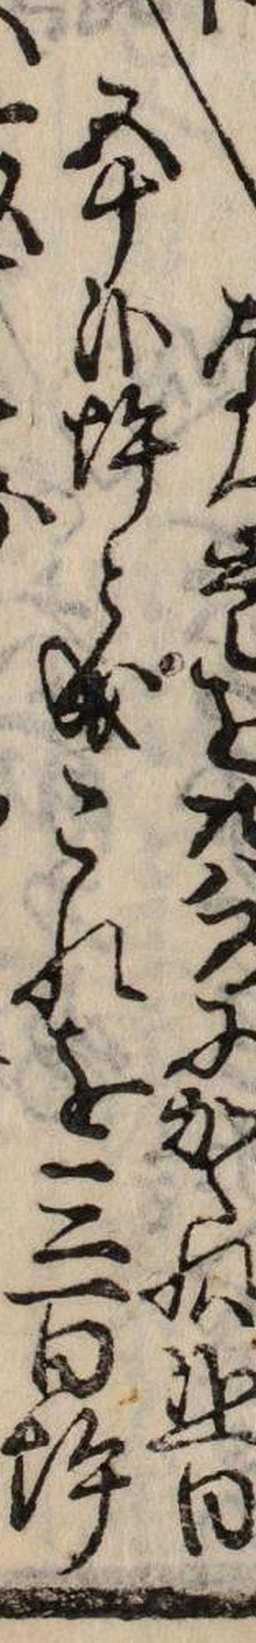五十弐坪に成これを三百坪＃
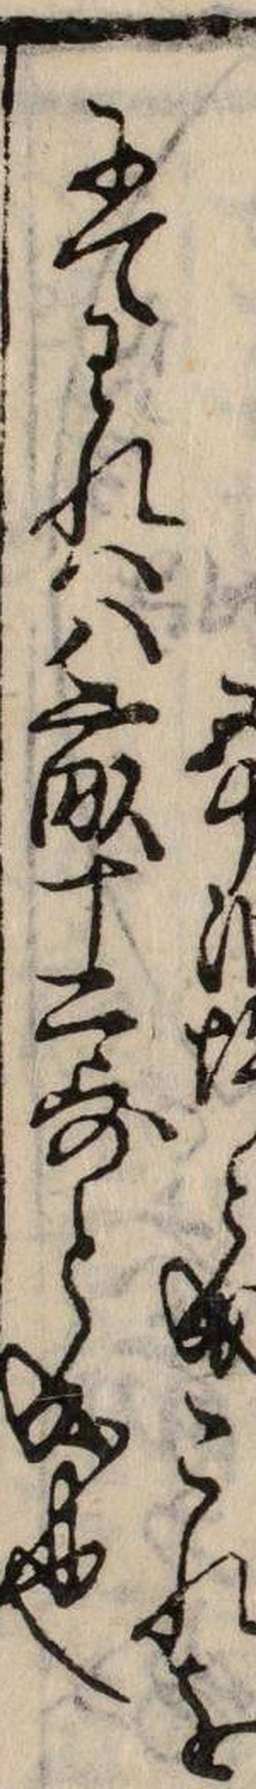にてわれは八畝十二歩と成也
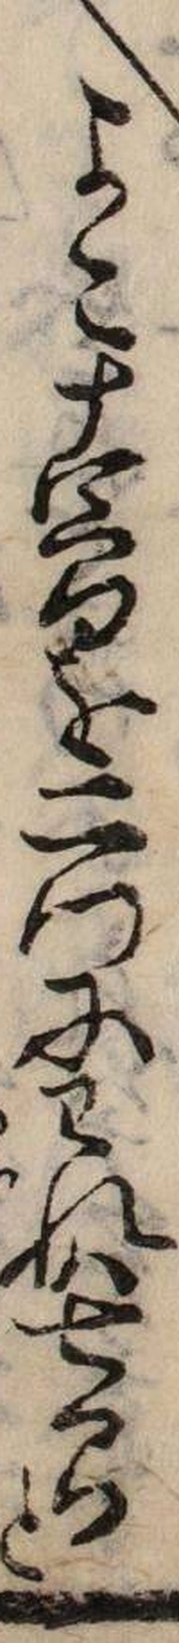よこ十四間を二つにわれは七間と
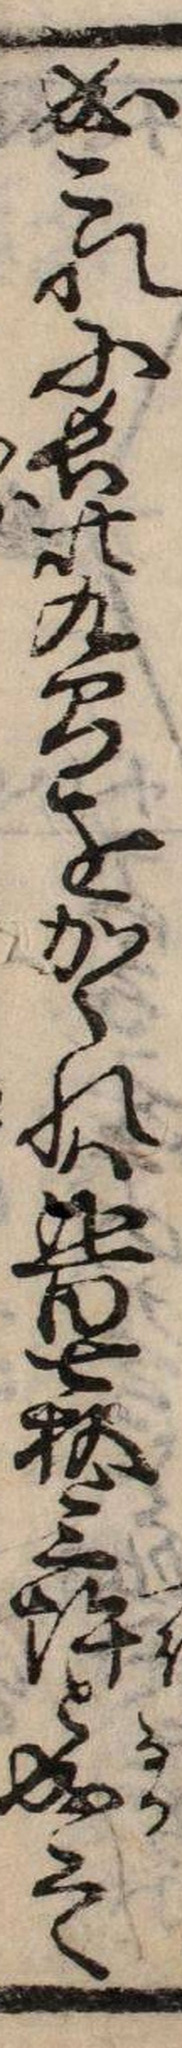成これに長丗九間をかくれは弐百七拾三坪と成是
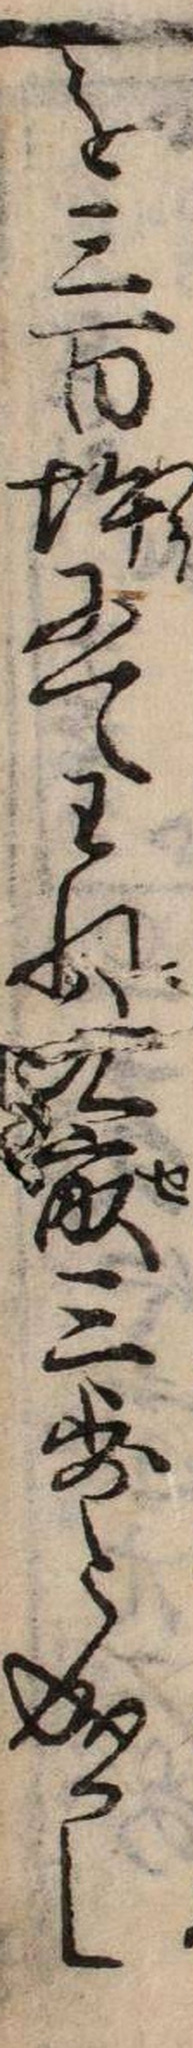を三百坪＃にてわれは九畝三歩と成申候

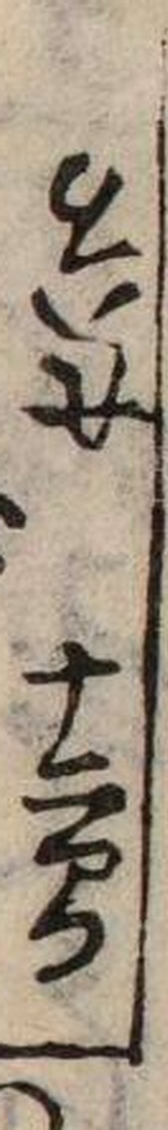十四間
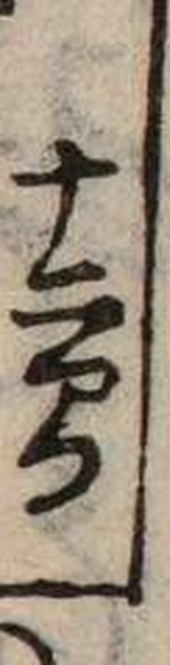十四間
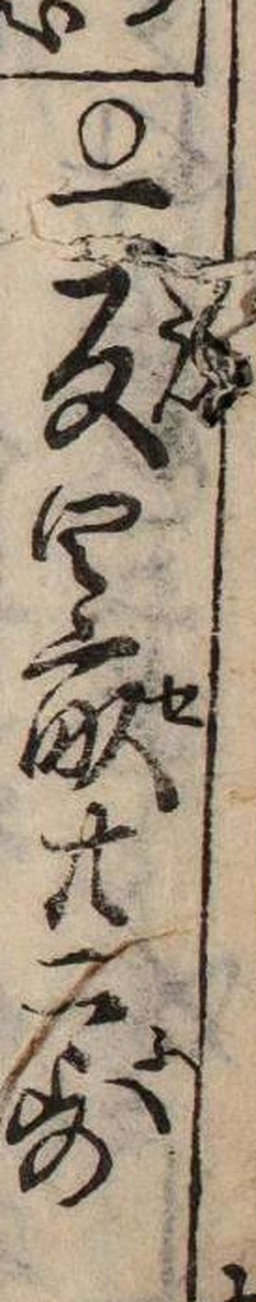○一反四畝廿二歩
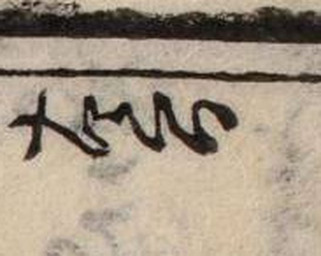十四間
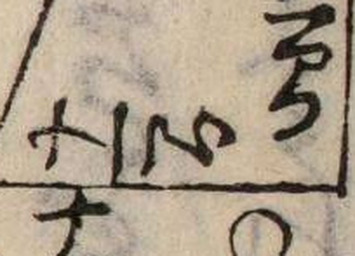十四間
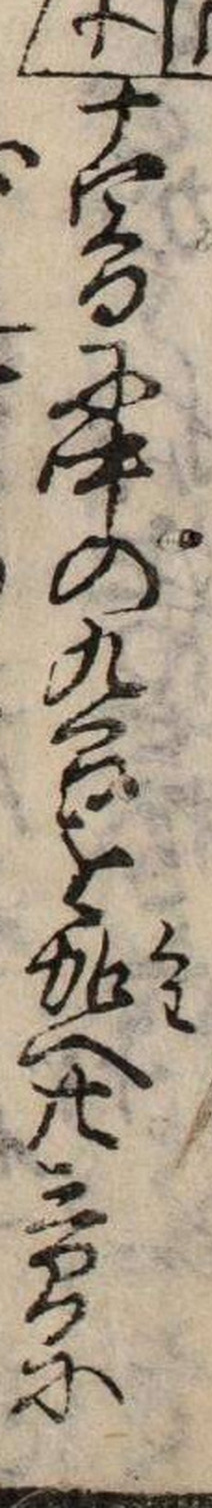十四間に中の九間を加へ廿三間に
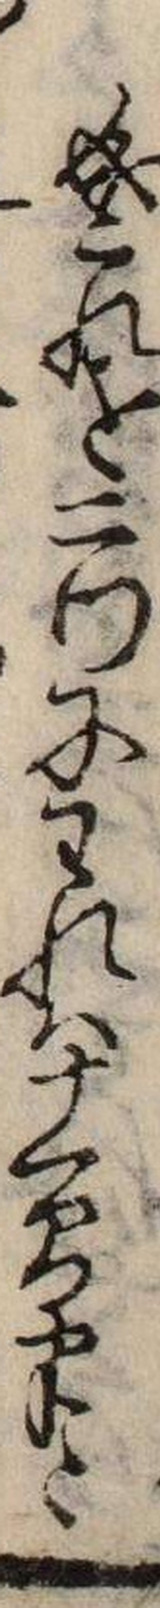成これを二つにわれは十一間半と
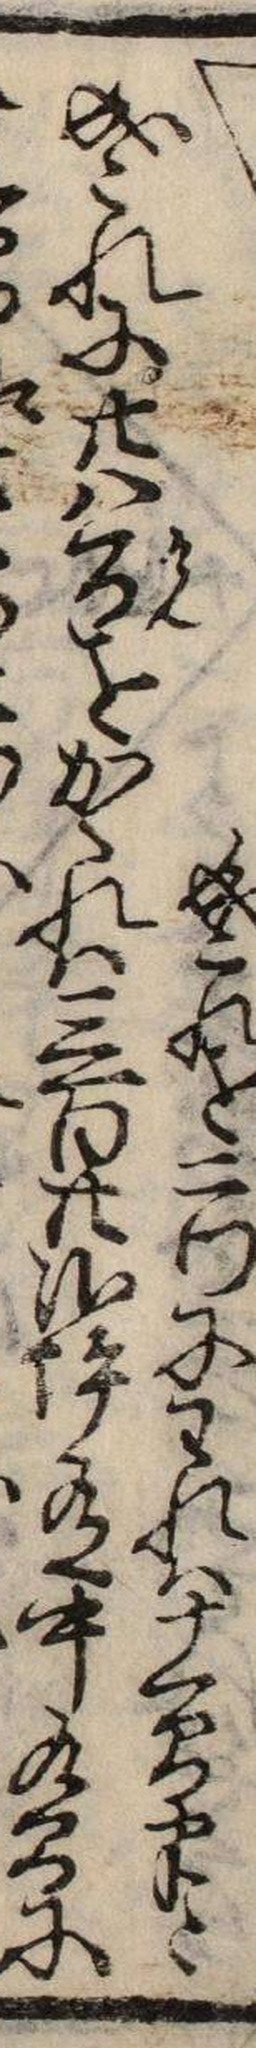成これに廿八間をかくれは三百廿弐坪有中九間に
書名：塵劫記（寛永11年自跋、京都府立京都学・歴彩館追貴8）
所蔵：京都府立京都学・歴彩館 国文学研究資料館
